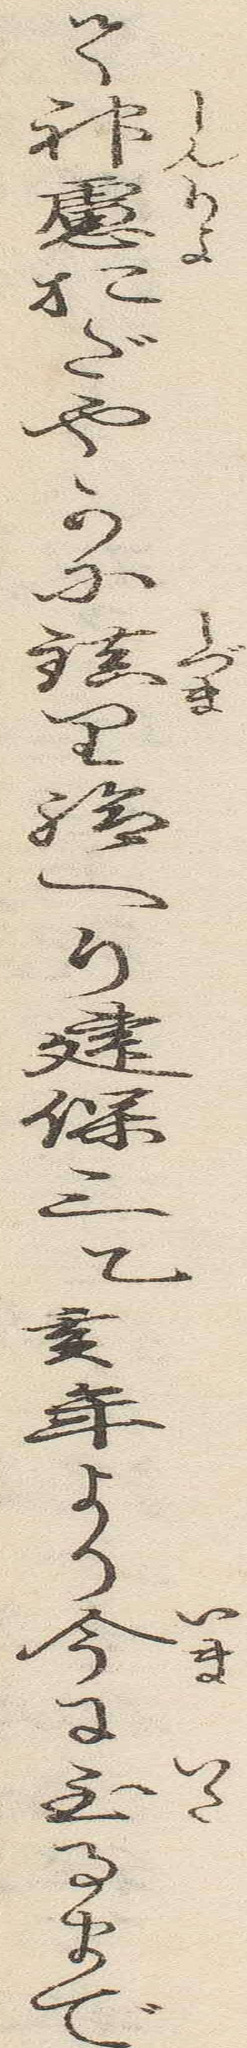て神慮おだやかに鎮り給へり建保三乙亥年より今に至るまで
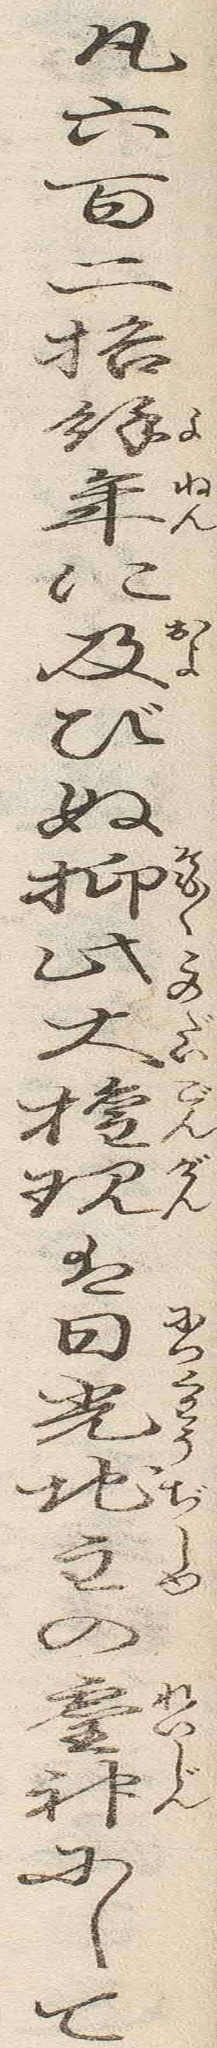凡六百二拾餘年に及びぬ抑此大權現は日光地主の靈神にして
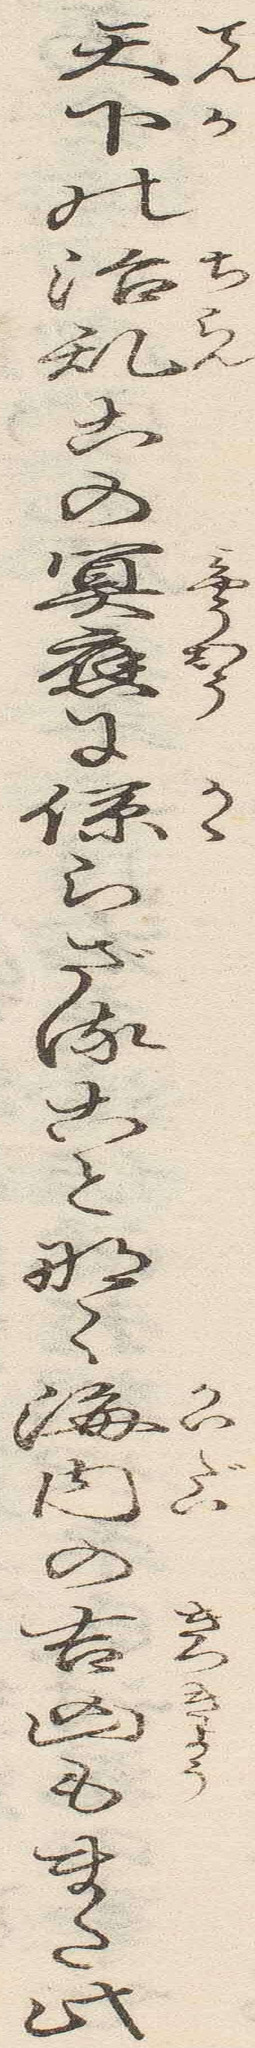天下の治乱この冥應に係らざることなく海内の吉凶もまた此
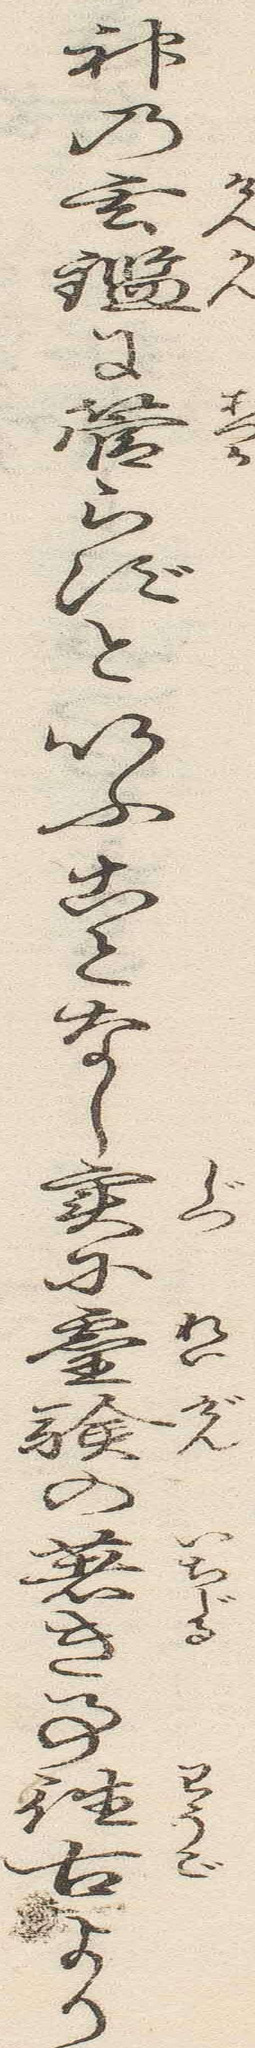神の玄鑑に管らずといふことなし実に靈験の著き事徃古より
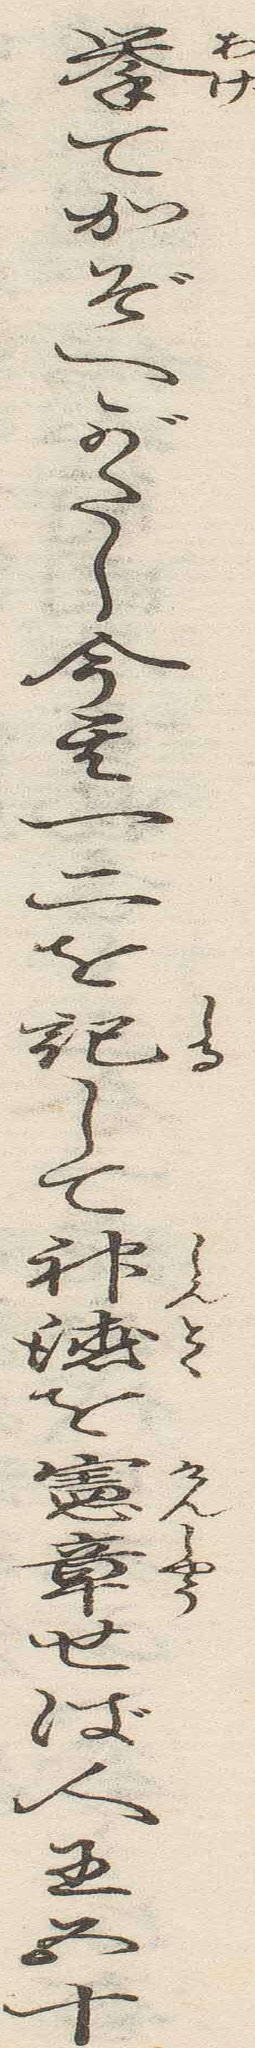挙てかぞへがたし今は一二を記して神德を憲章せば人王五十
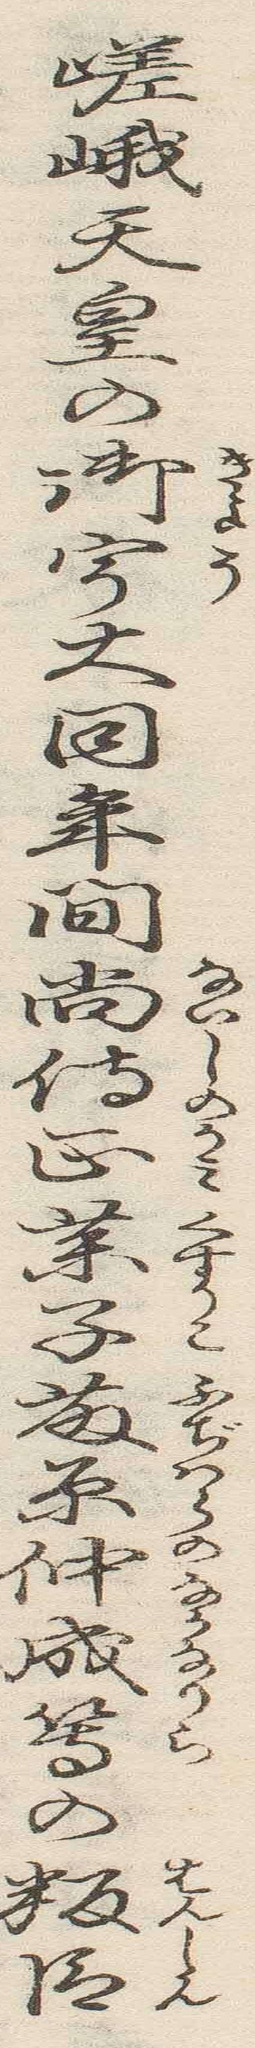嵯峨天皇の御宇大同年間尚侍正薬子藤原仲成等の叛臣
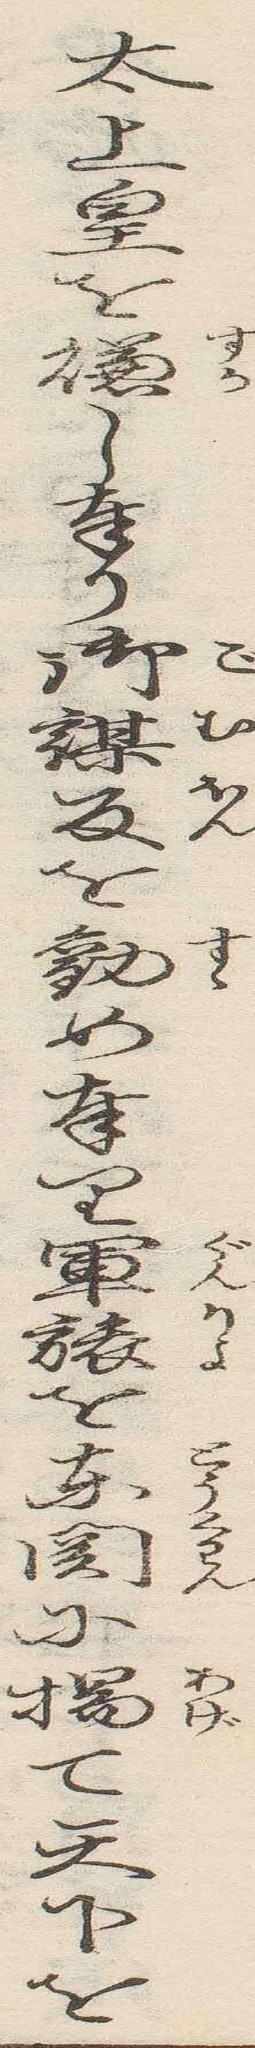太上皇を賺し奉り御謀反を勸め奉り軍旅を東関に揚て天下を
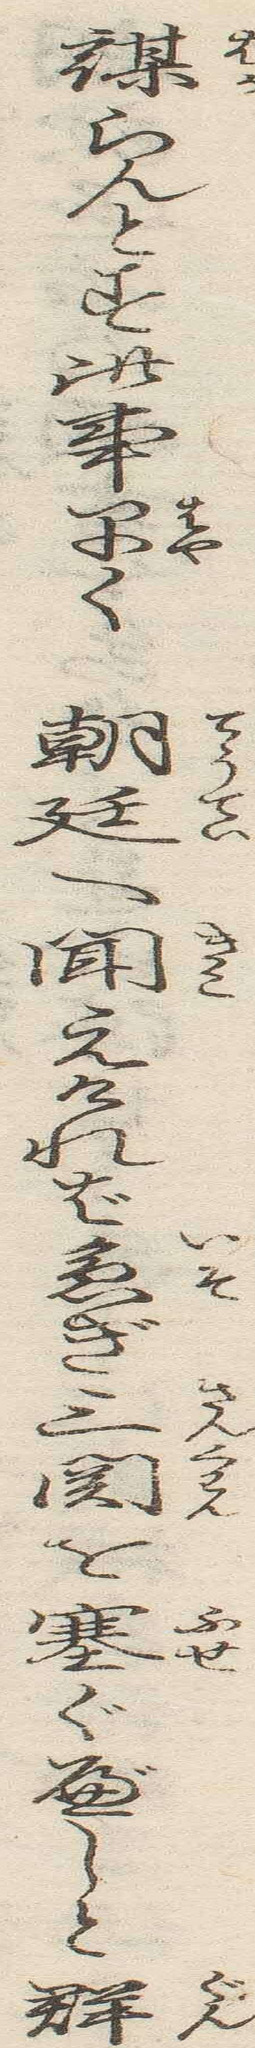謀らんとす此事早く朝廷へ聞えければ急ぎ三関を塞ぐべしと群
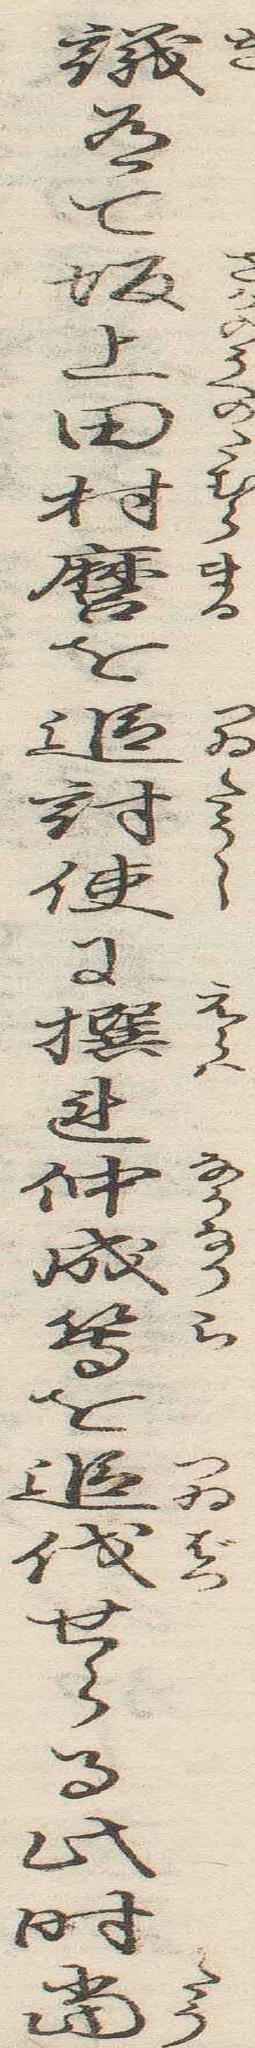議有て坂上田村麿を追討使に撰れ仲成等を追伐せらる此时當
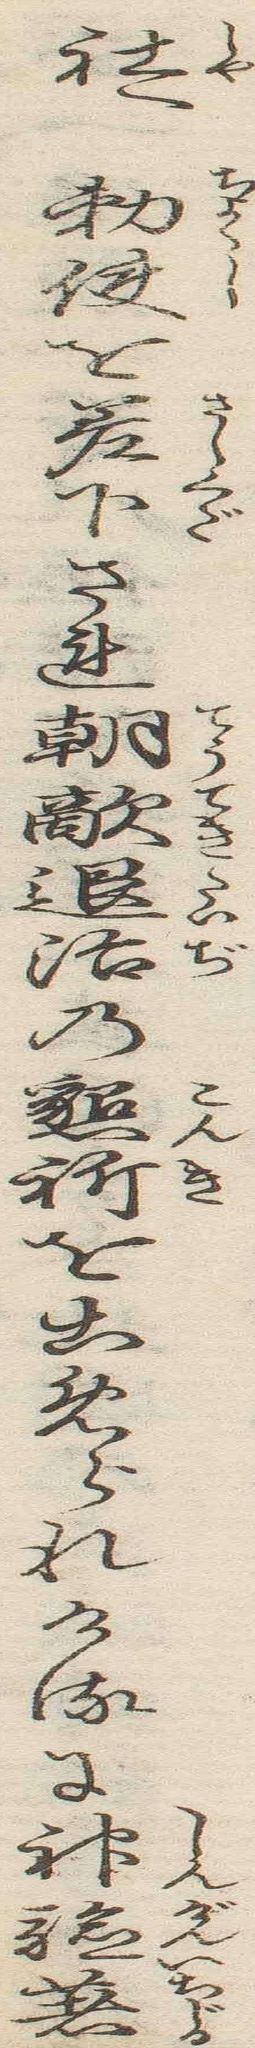社へ勅使を差下され朝敵退治の懇祈をこめられけるに神驗著
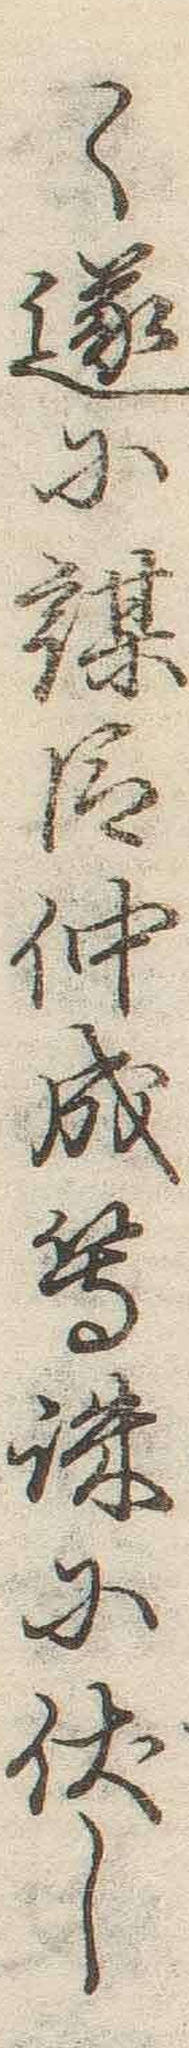く遂に謀臣仲成等誅に伏し

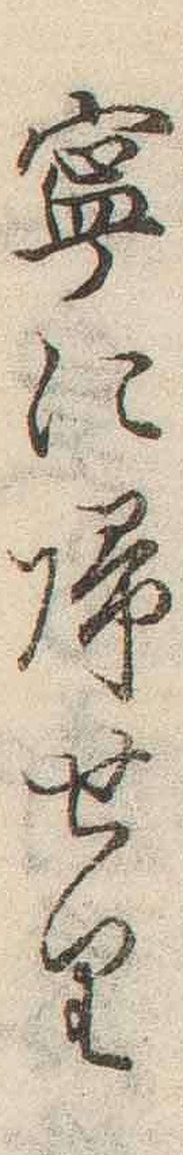寧に帰せり
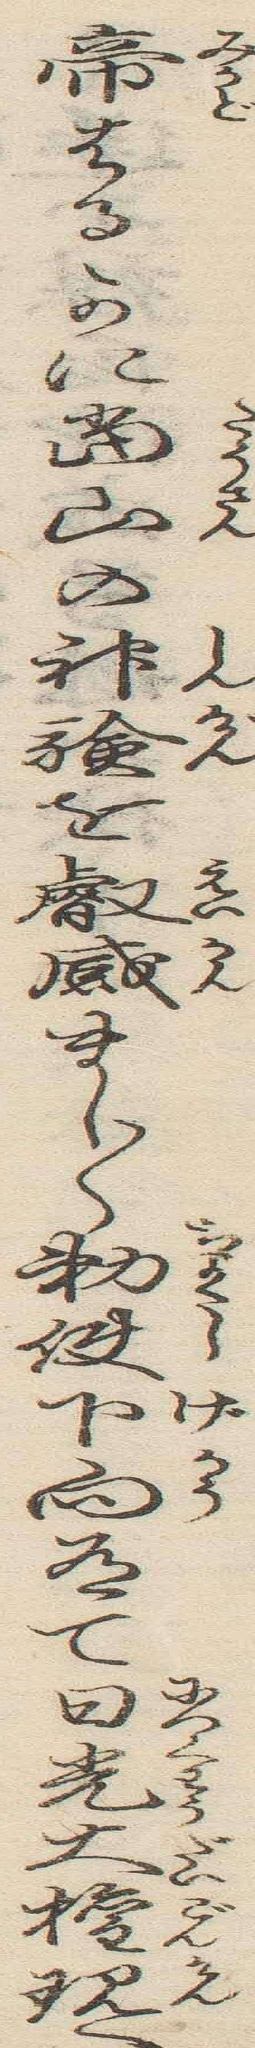帝はるかに當山の神験を叡感まし〳〵勅使下向有て日光大權現へ
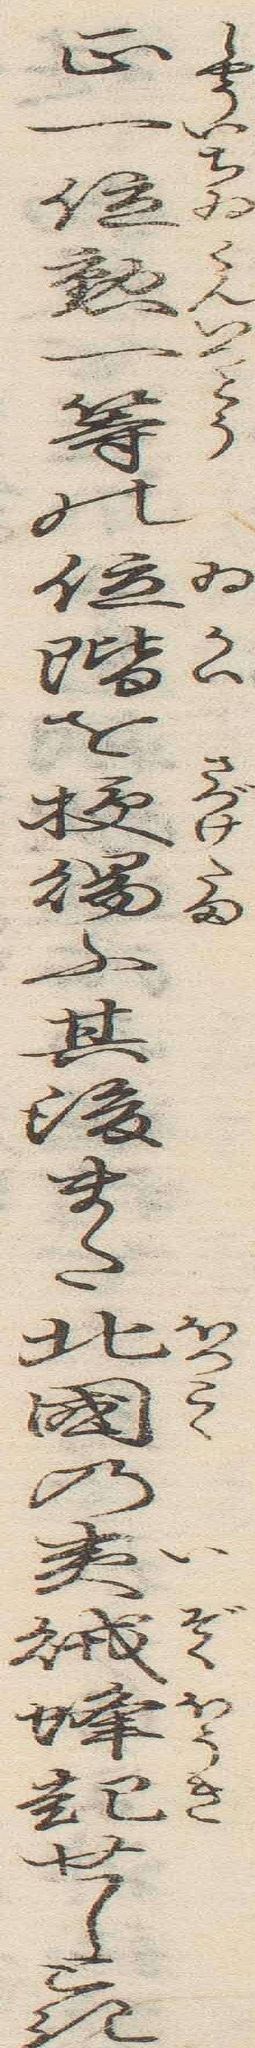正一位勲一等の位階を授賜ふ其後また北國の夷賊蜂起せしとき
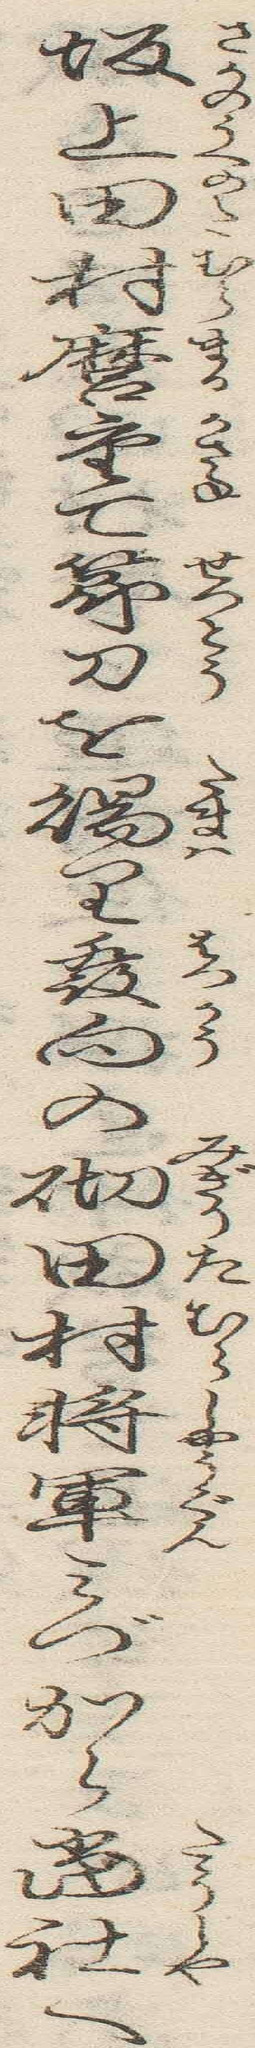坂上田村麿重て節刀を賜り發向の砌田村将軍みづから當社へ
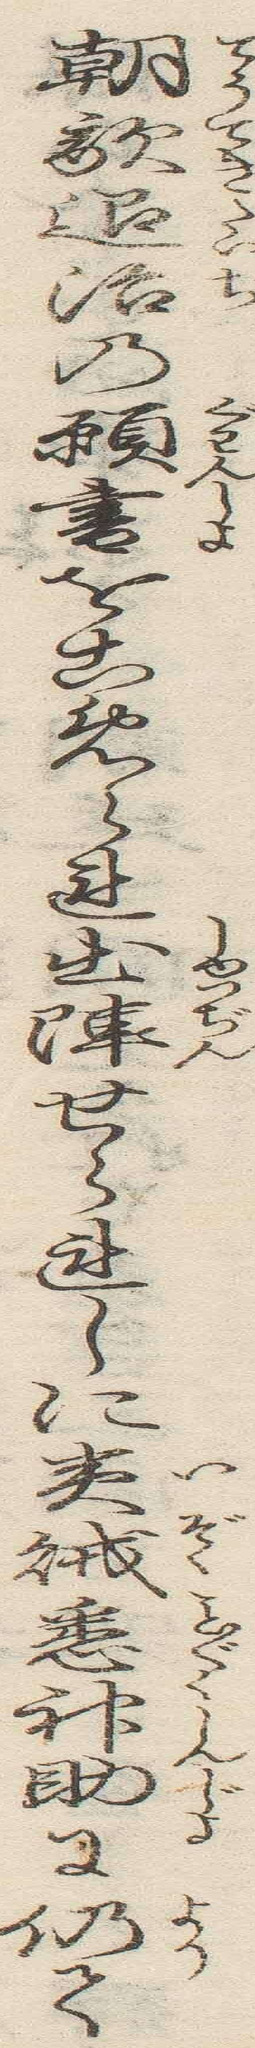朝敵退治の願書をこめられ出陣せられしに夷賊悉神助に仍て
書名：日光山志
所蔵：東京学芸大学附属図書館 国文学研究資料館
